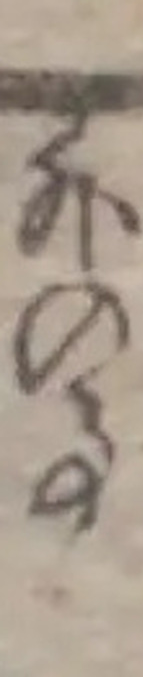外の事
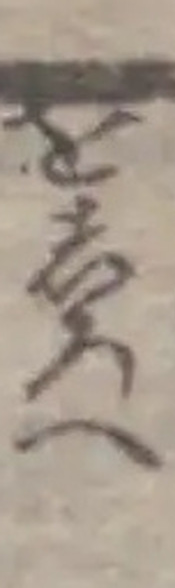をしろへ
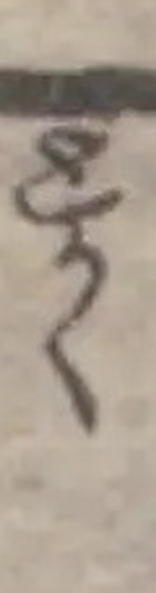とかく
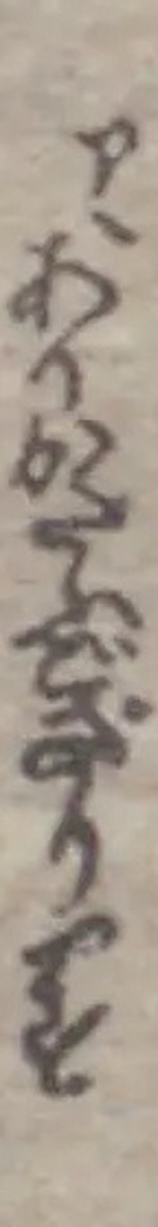アヽありがたふござりやす
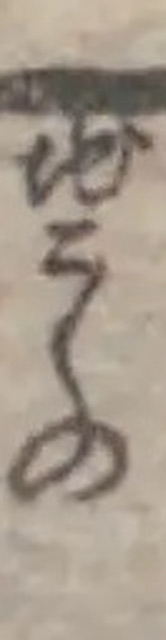地こくの
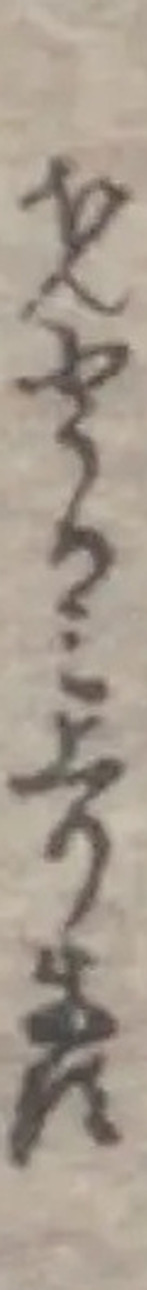ほんにうかみ上ります
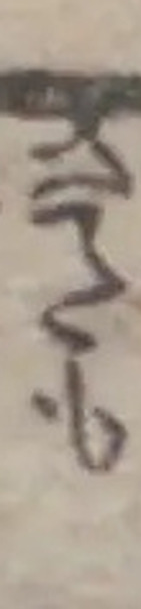さたも
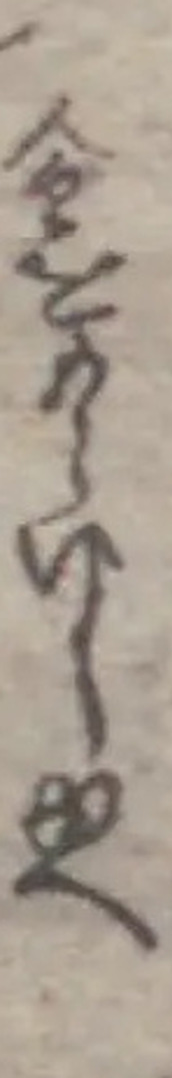金をもらいしゆへ
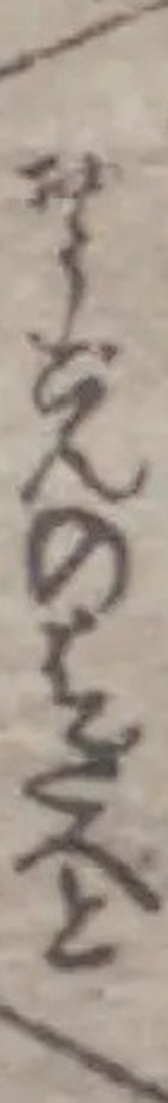おうごんのはだへと
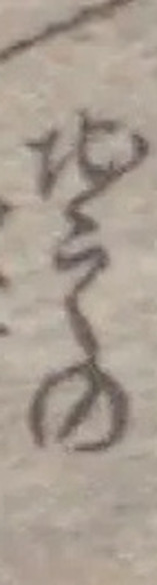地こくの

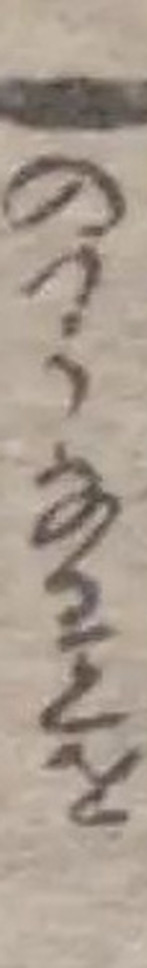のつうなることを
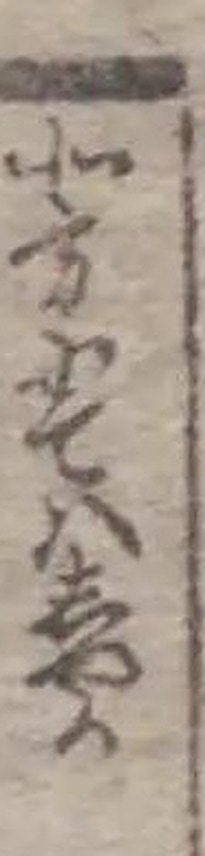北方にてはしやか
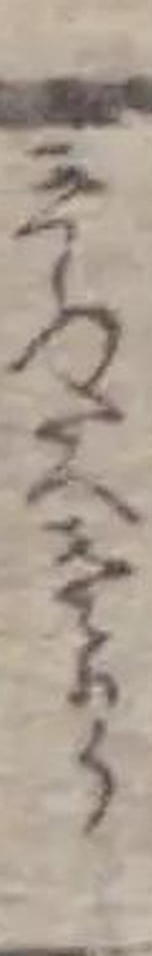きゝつたへきよう
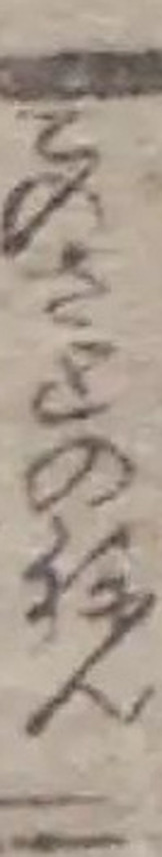このさとのねん
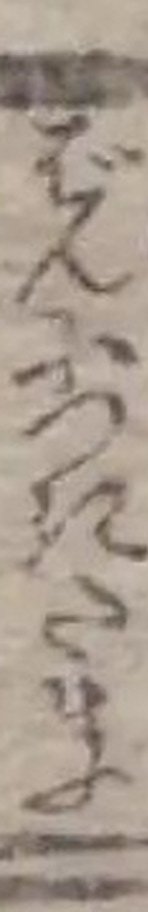ばんにつきたまふ
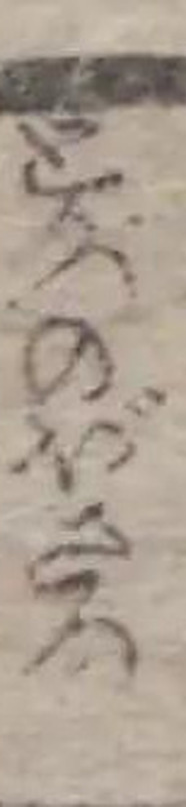とかづのぼさつ
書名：早出来 3巻
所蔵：国立国会図書館 National Diet Library, JAPAN
